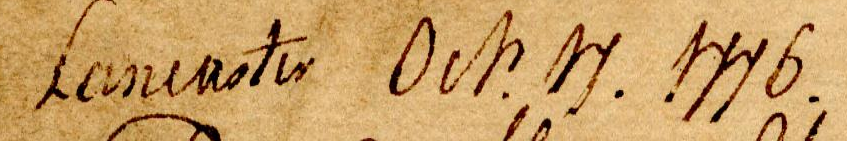Lancaster Oct. 17. 1776.
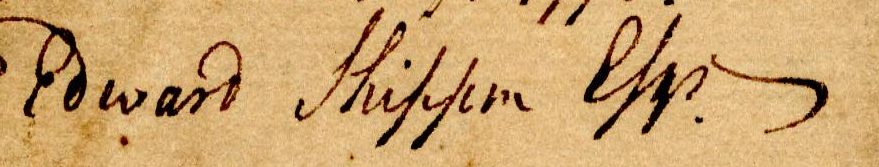Edward Shippen Esq^r.
